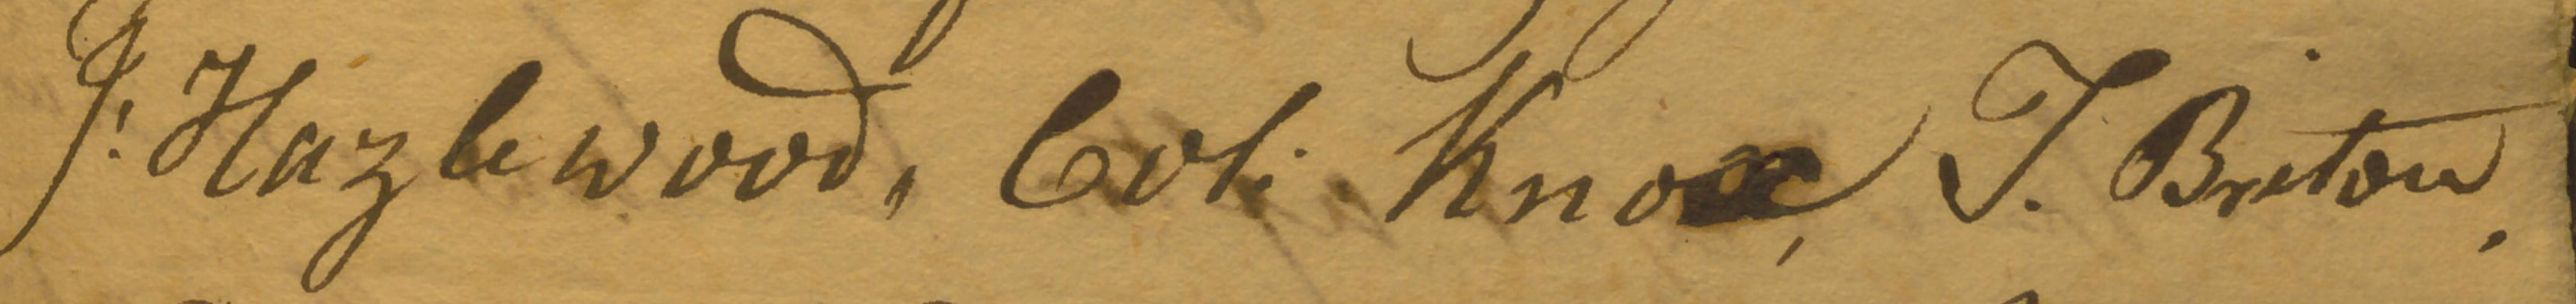J. Hazlewood, Col. Knox, T. Briton,
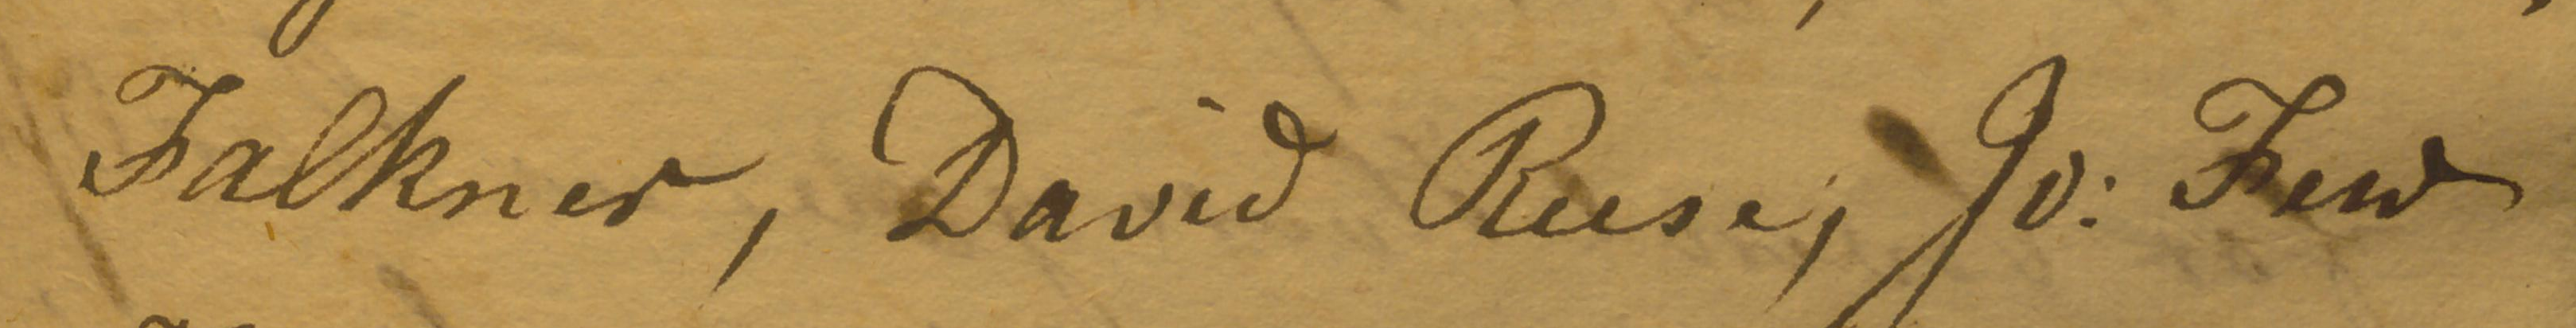Falkner, David Reese, Jo: Few
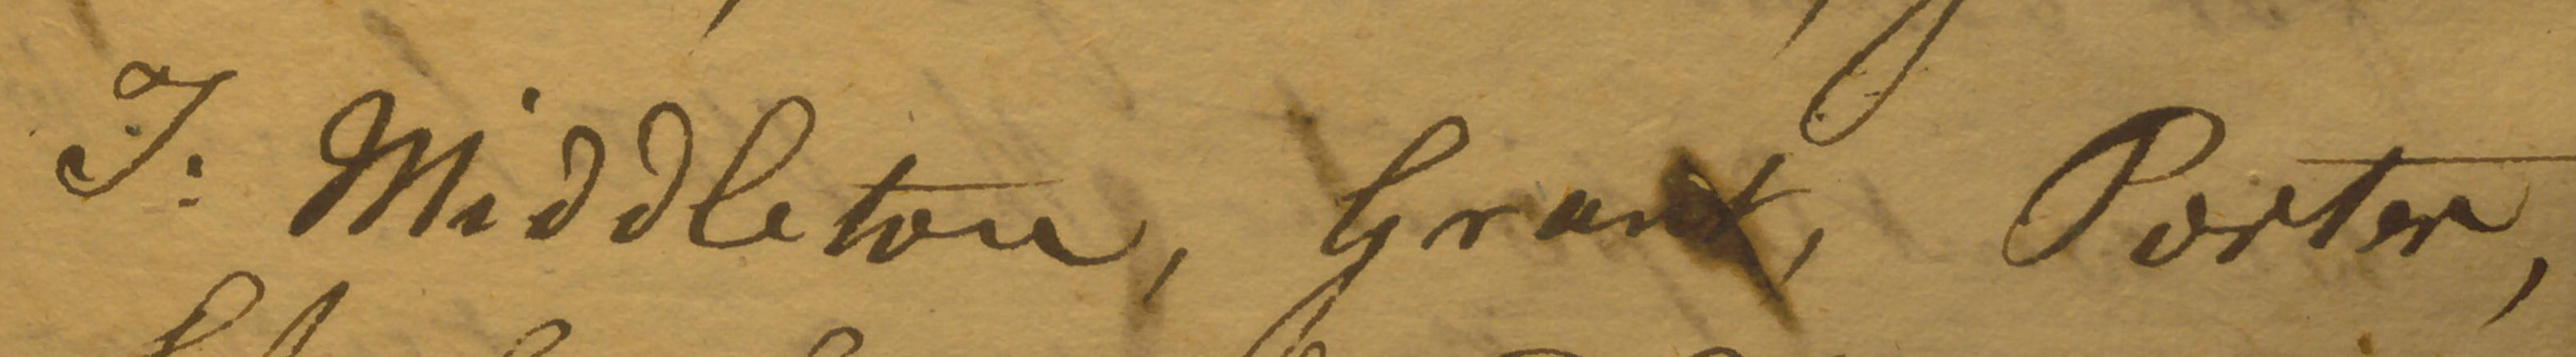T: Middleton, Grant, Porter,
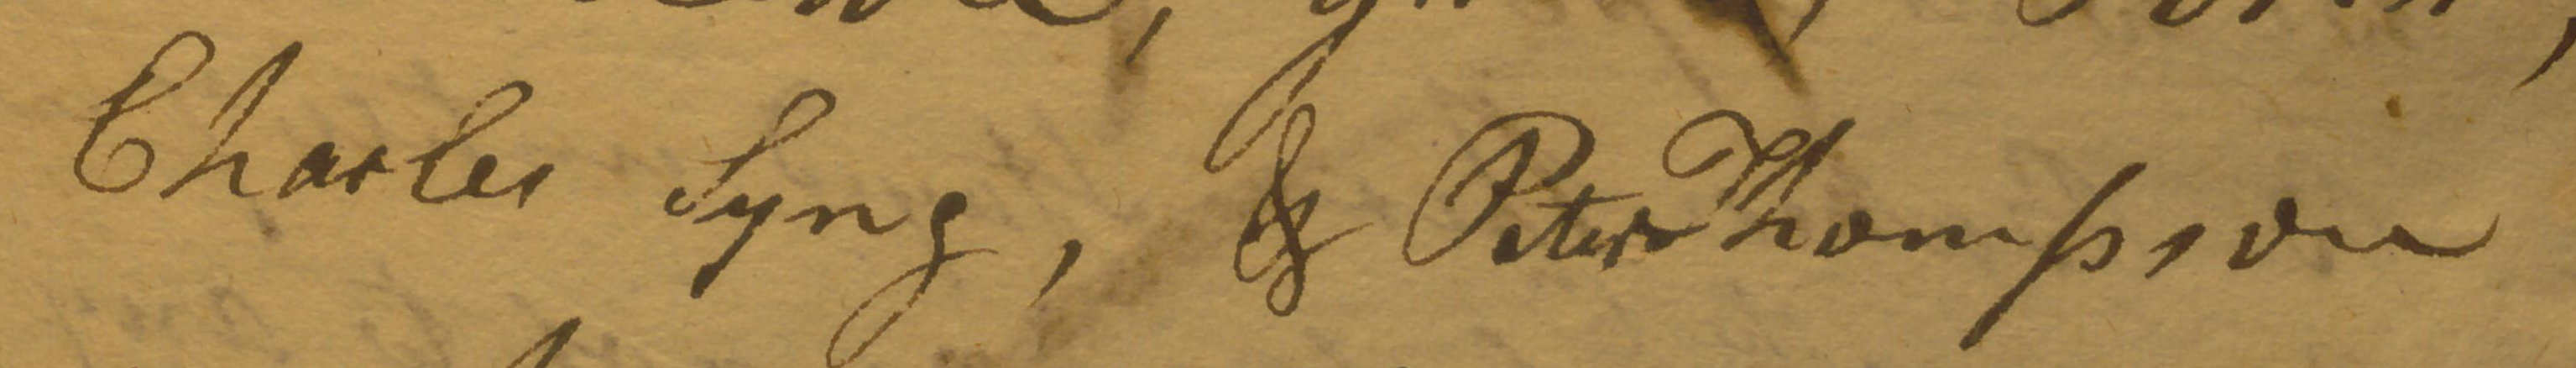Charles Syng, & Peter Thompson
